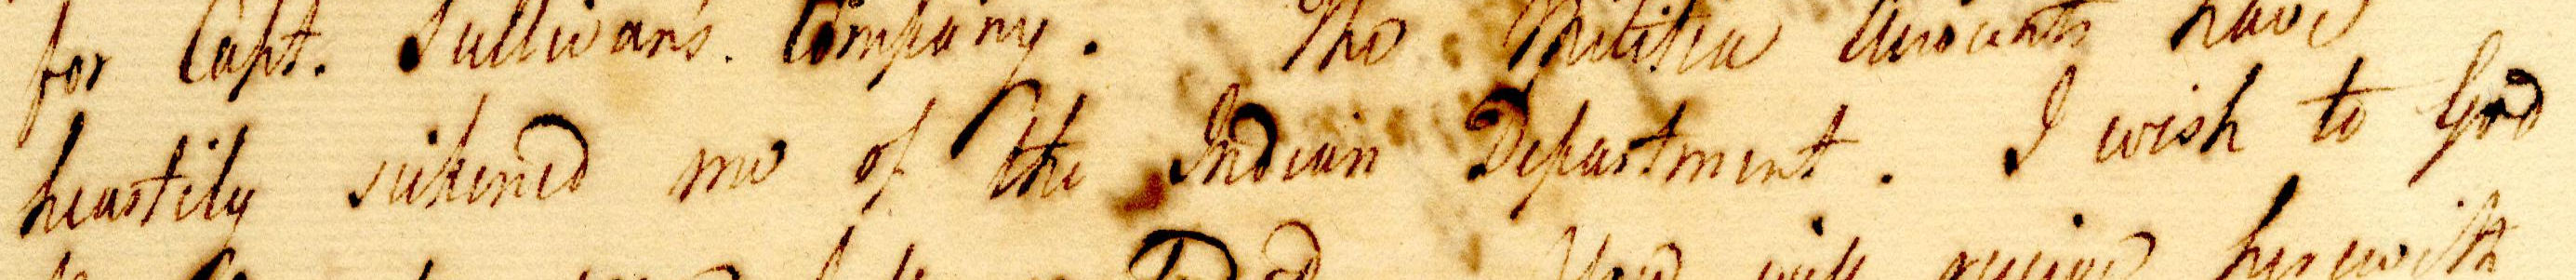heartily sickened me of the Indian Department. I wish to God
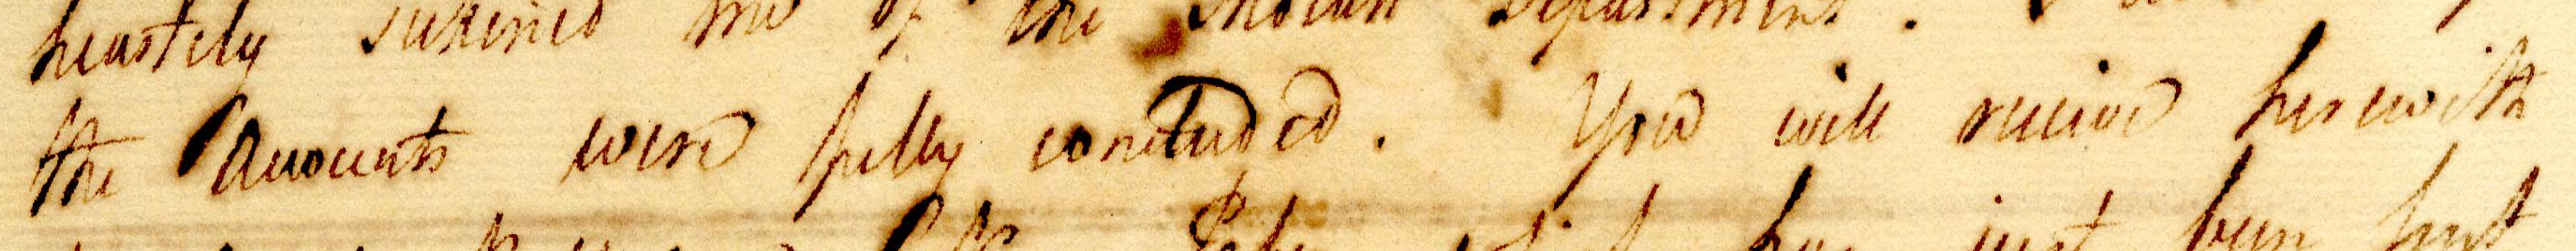the Accounts were fully concluded. You will receive herewith
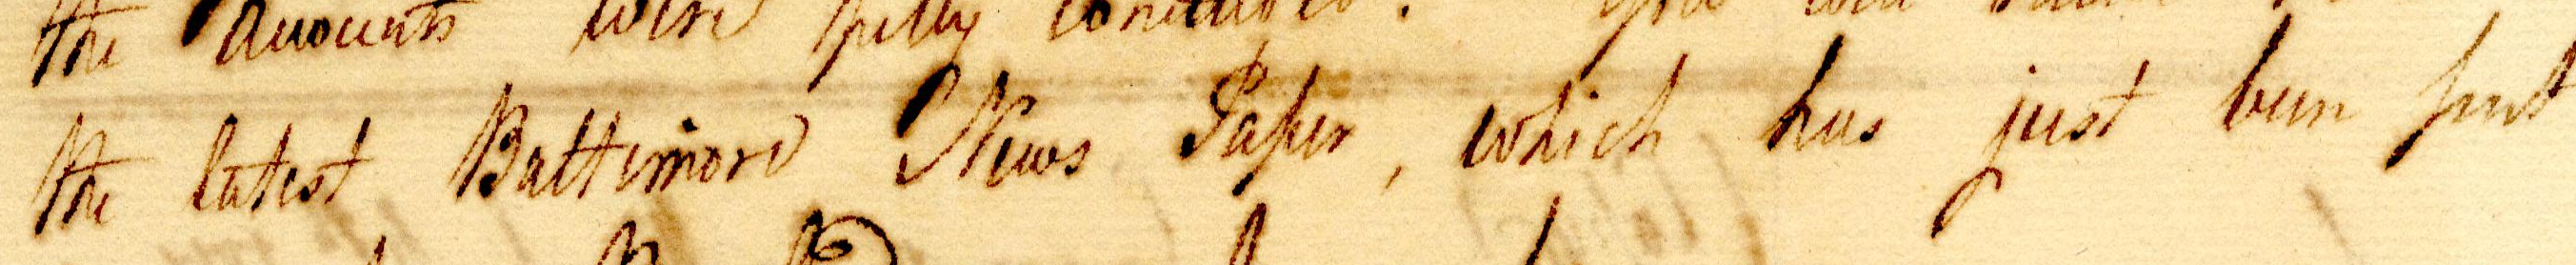the latest Baltimore News Paper, which has just been sent
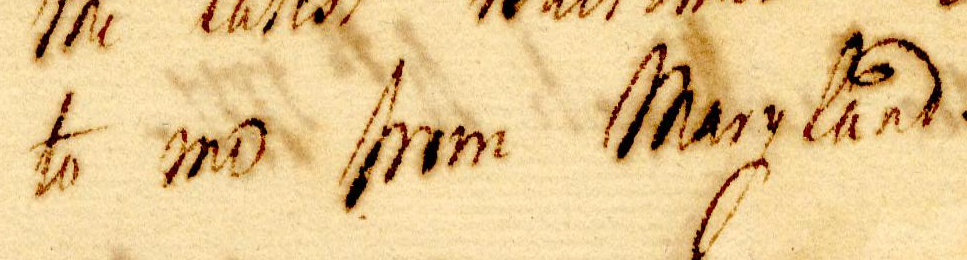to me from Maryland.
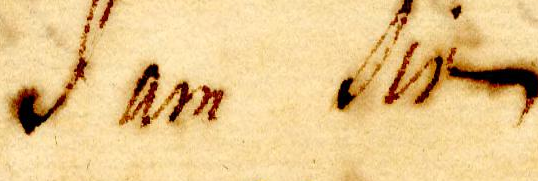I am Sir
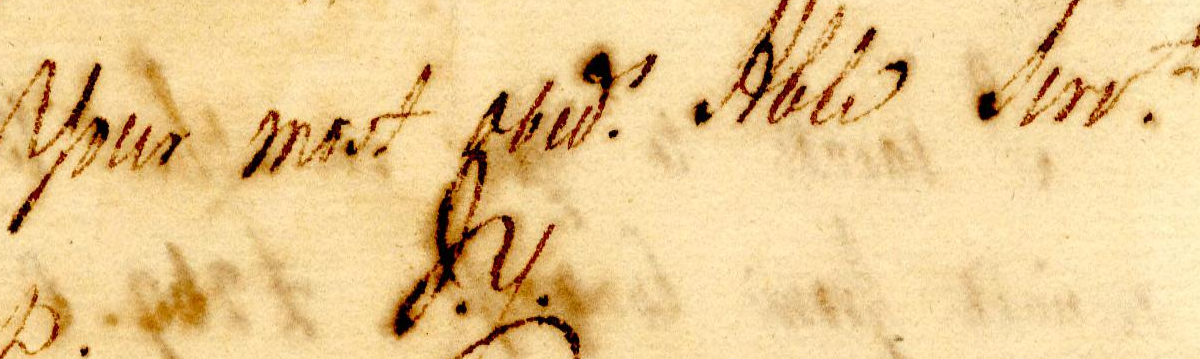Your most obed^t Hble Serv^t.
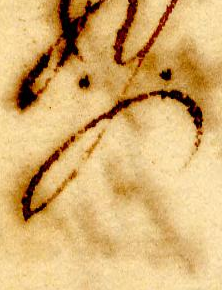J.Y.
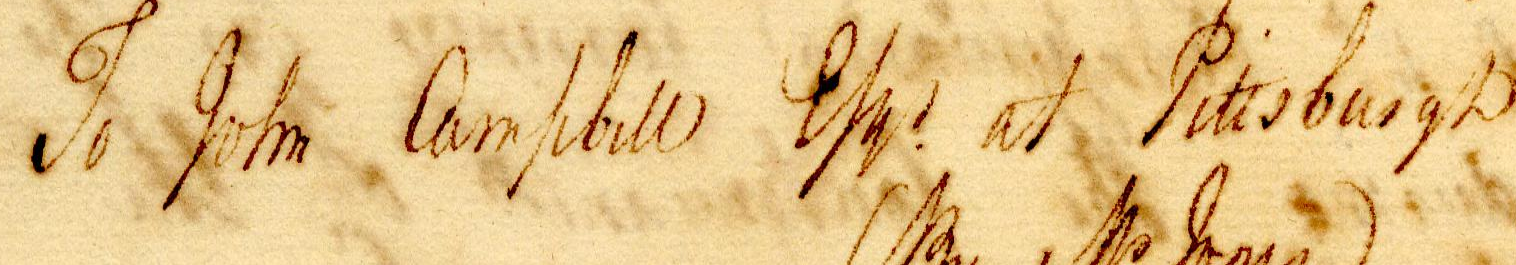To John Campbell Esq^r at Pittsburgh.
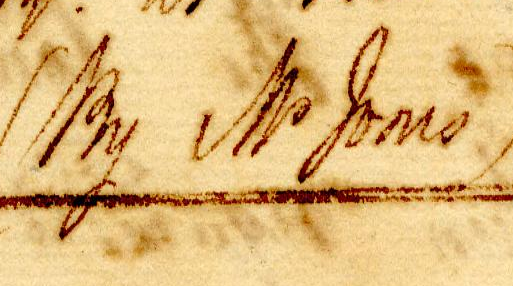(By M^r Jones)
